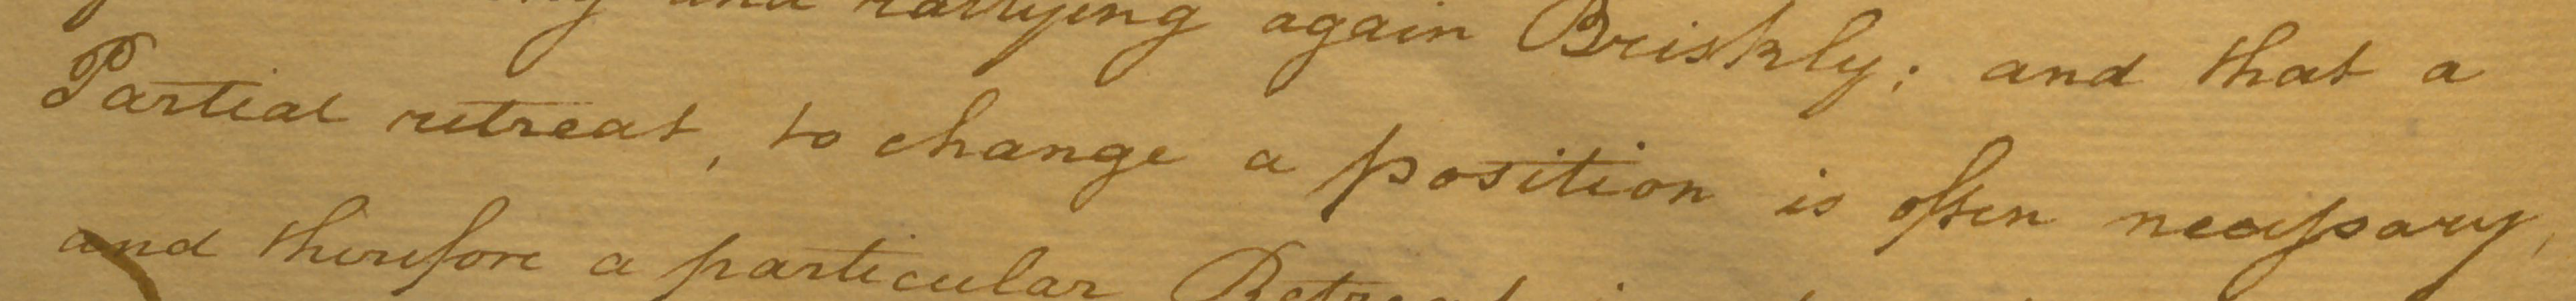Partial retreat to change a position is often necissary
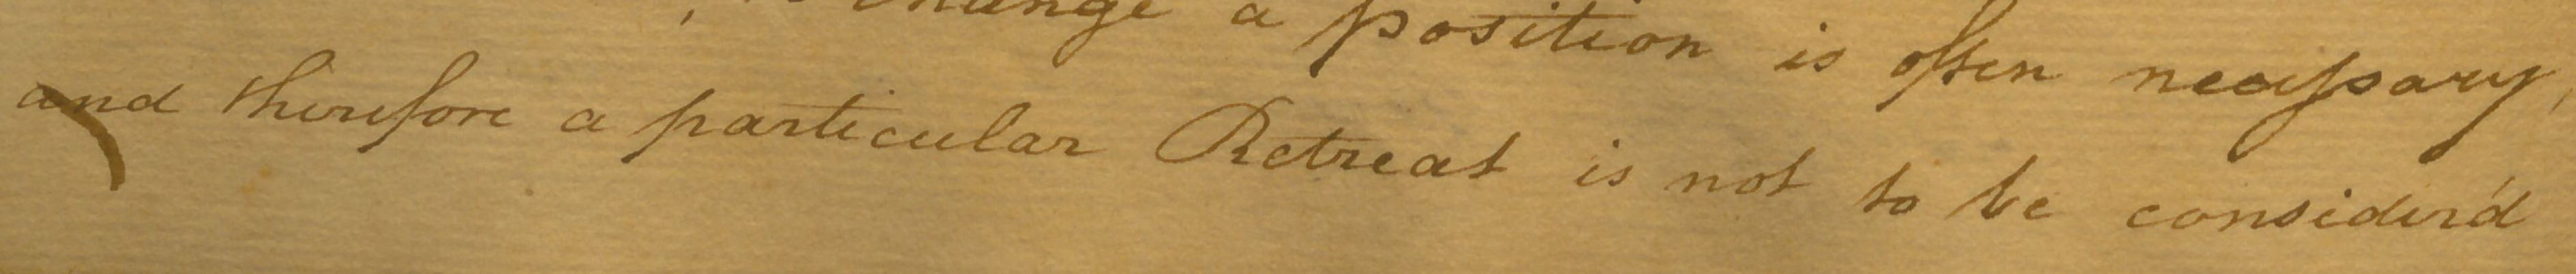and therefore a particular Retreat is not to be consider'd
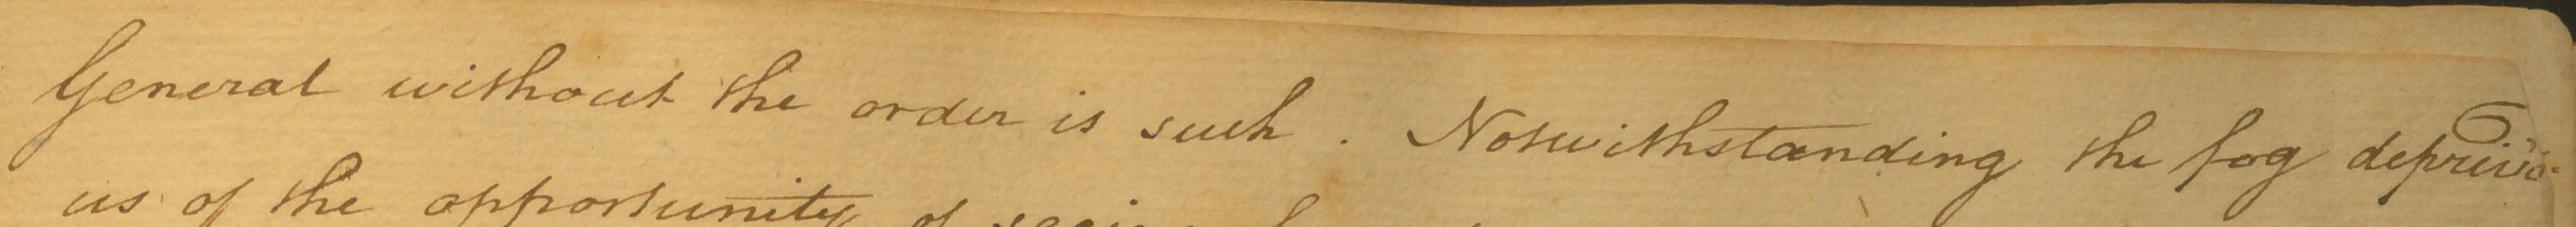General without the order is such. Notwithstanding the fog depriv'd
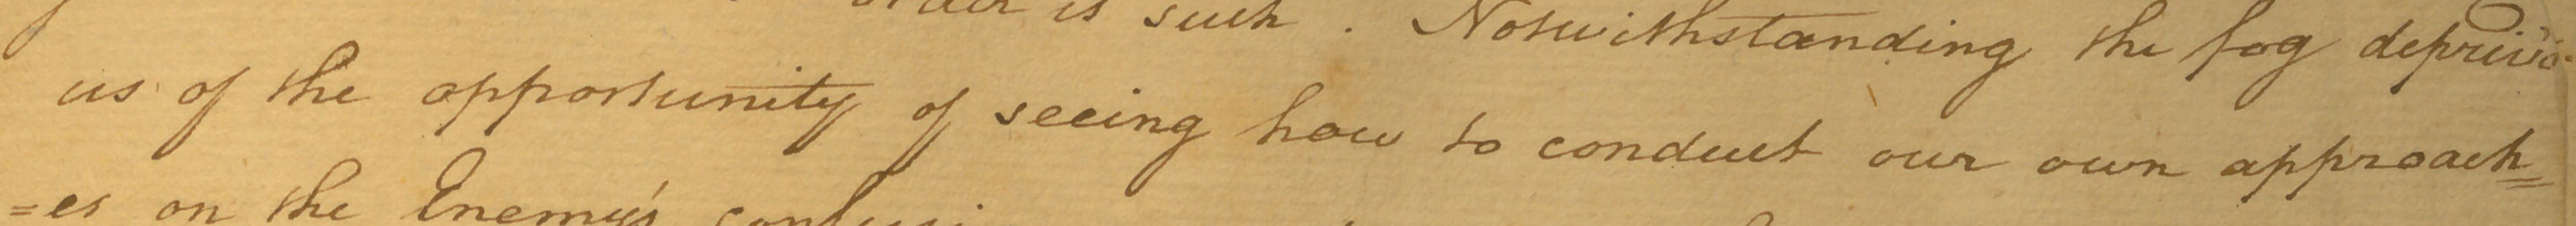us of the opportunity of seeing how to conduct our own approach-
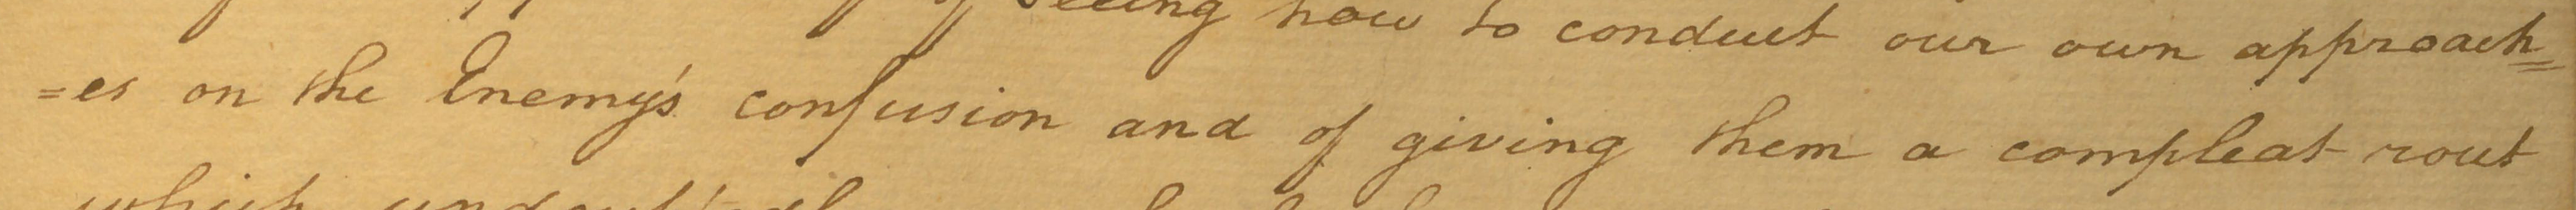-es on the Enemy's confusion and of giving them a compleat rout
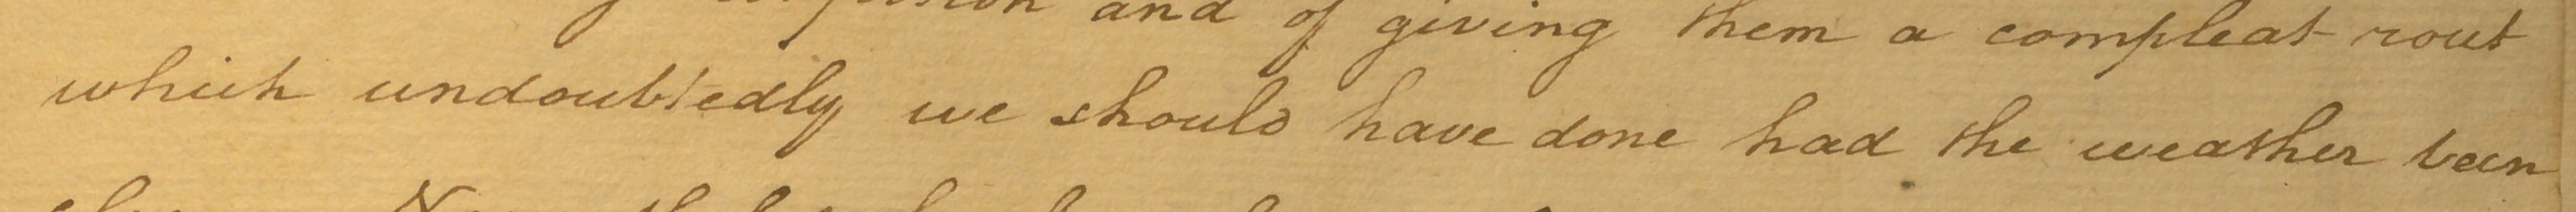which undoubtedly we should have done had the weather been
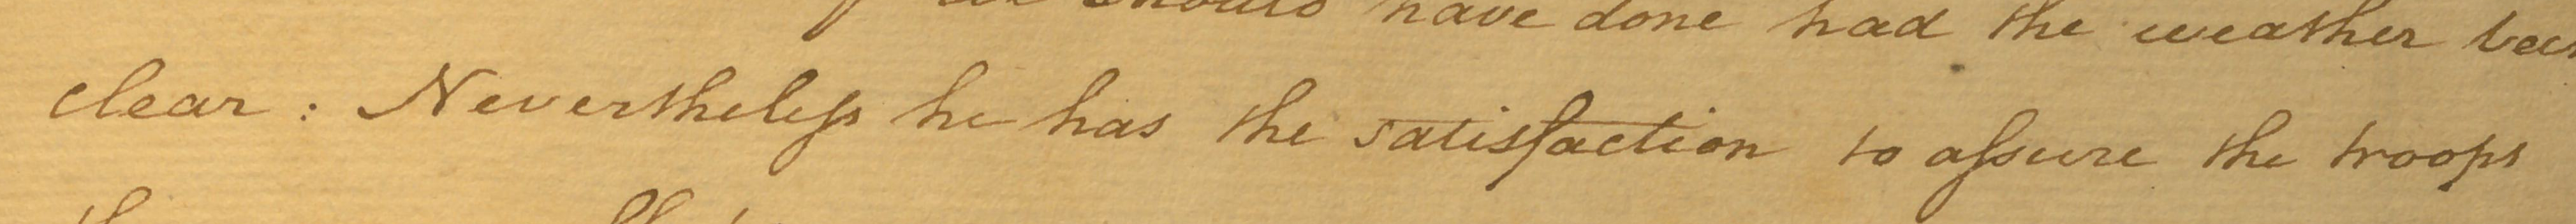clear. Nevertheless he has the satisfaction to assure the troops
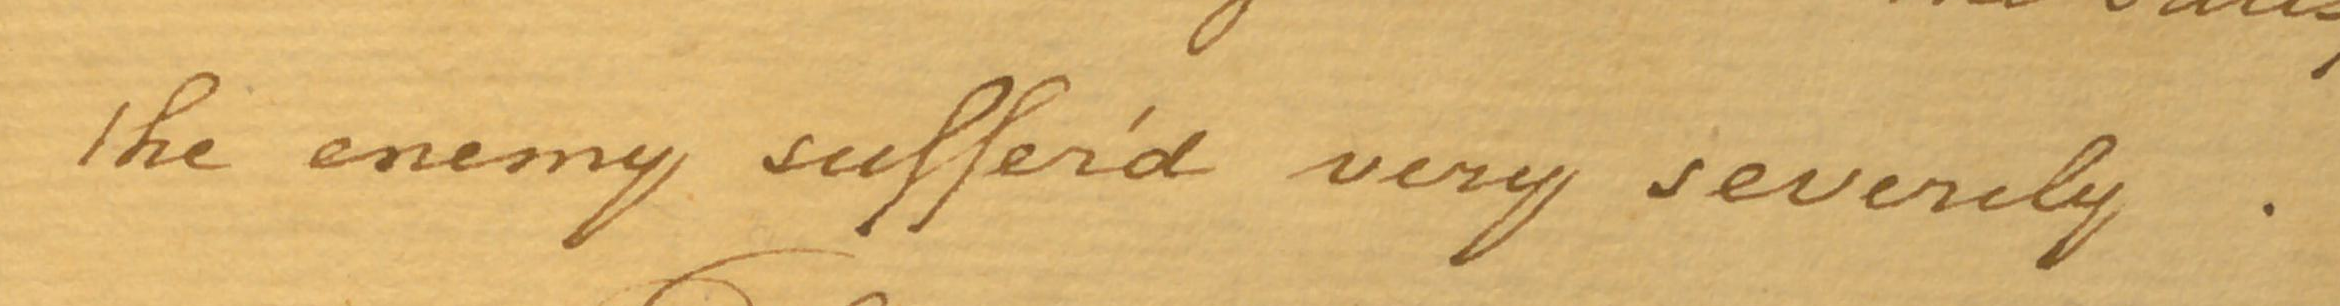the enemy suffer'd very severely.
